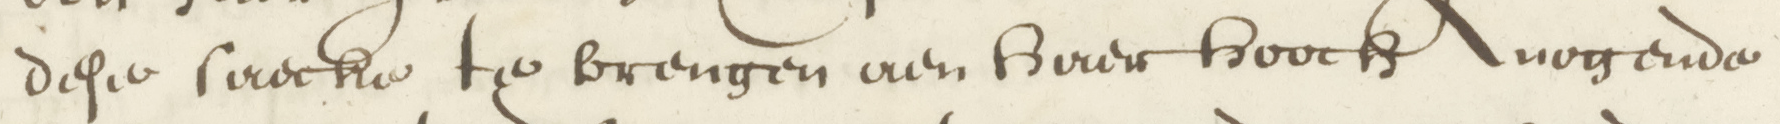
dese saecke te brengen aen haer hooch mogende
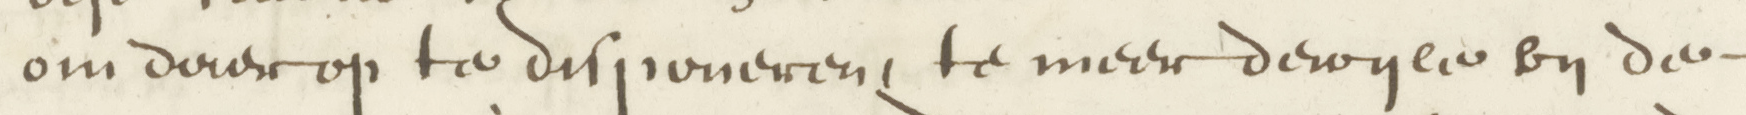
om daerop te disponeren, te meer dewyle by de
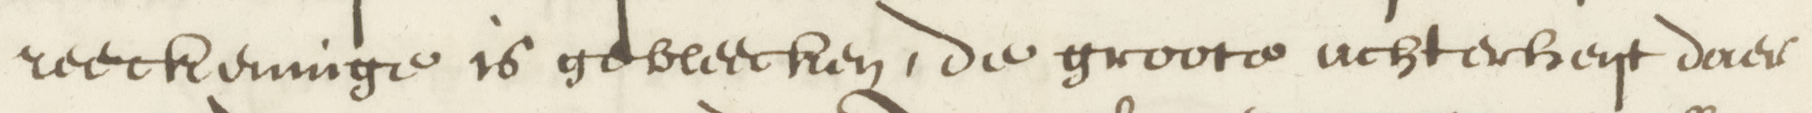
reeckeninge is gebleecken, de groote achterheyt daer
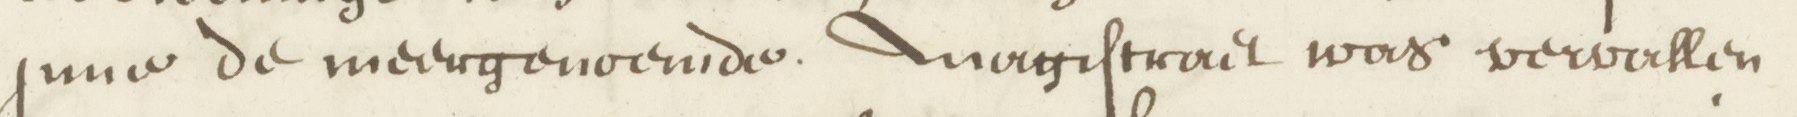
Inne de meergenoemde Magistraet was vervallen
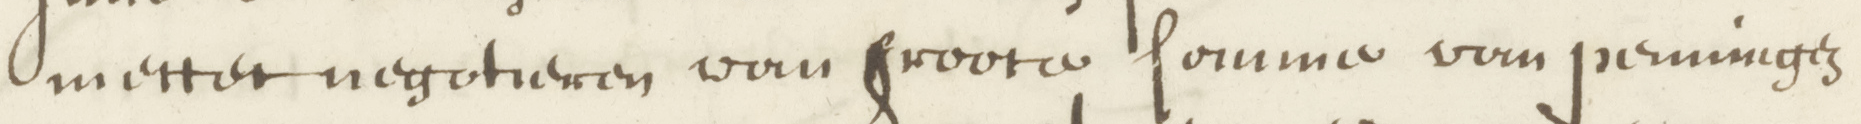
mettet negotieren van groote somme van penningen
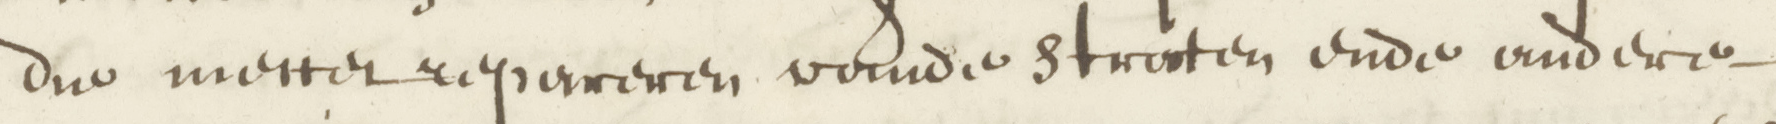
die mettet repareren vande straten ende andere
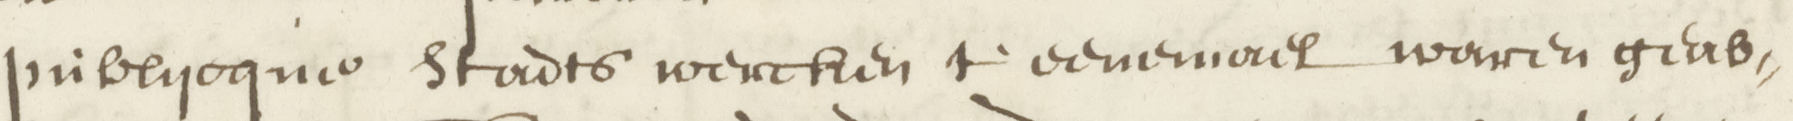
publycque stadts wercken t‛ eenemael waren geab„
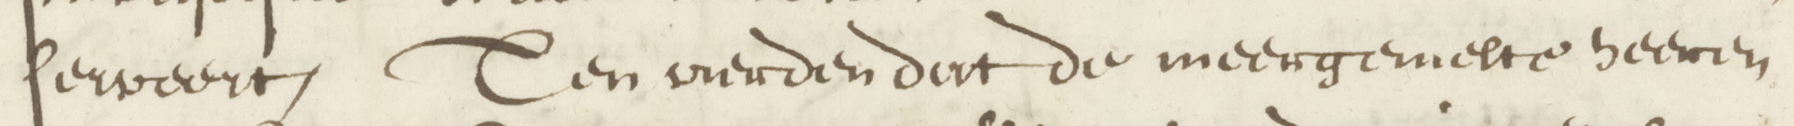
serveert. Ten vierden dat de meergemelte heeren
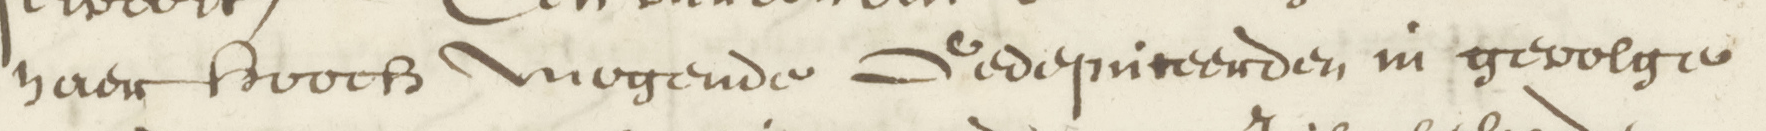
haer hooch mogende Gedeputeerden in gevolge
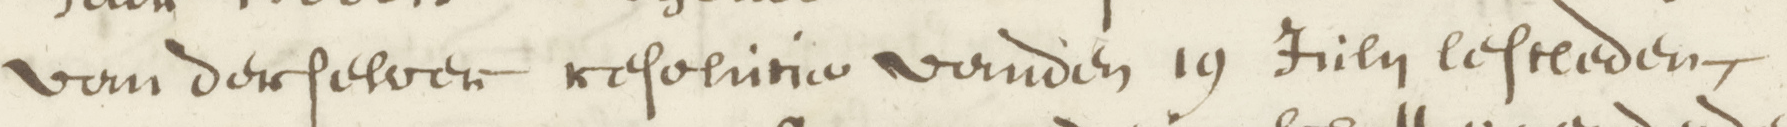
van derselver resolutie vanden 19 July lestleden,
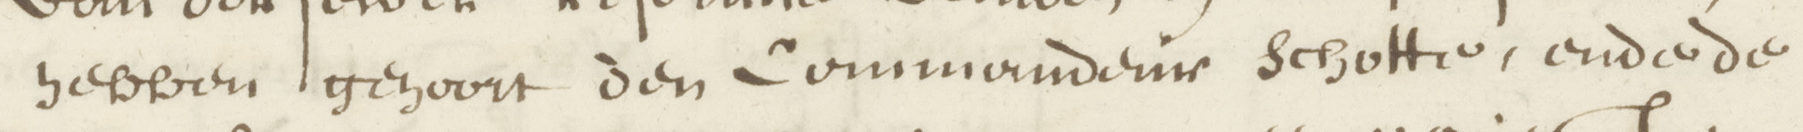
hebben gehoort den Commandeur schotte, ende de
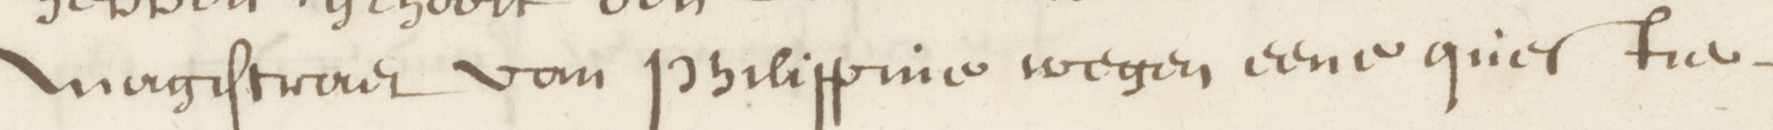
magistraet van philipine wegen eene questie
